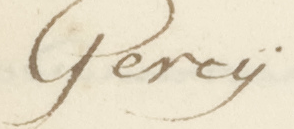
Gercij
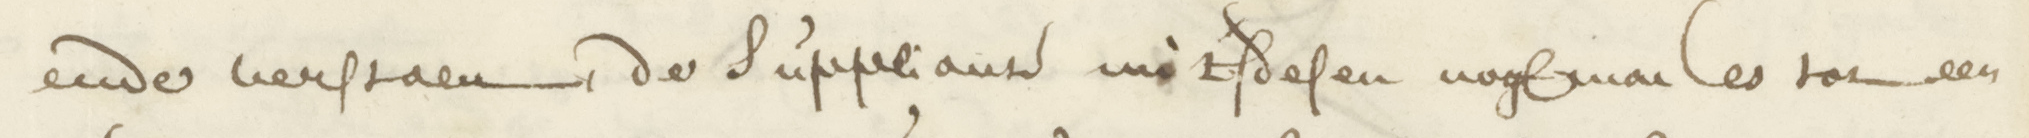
ende verstaen, de suppliante mitsdesen noghmaels tot een
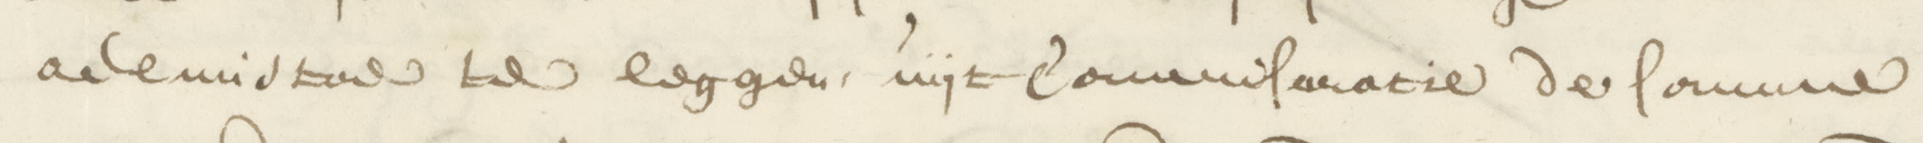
aelmis toe te leggen, uijt commiseratie de somme
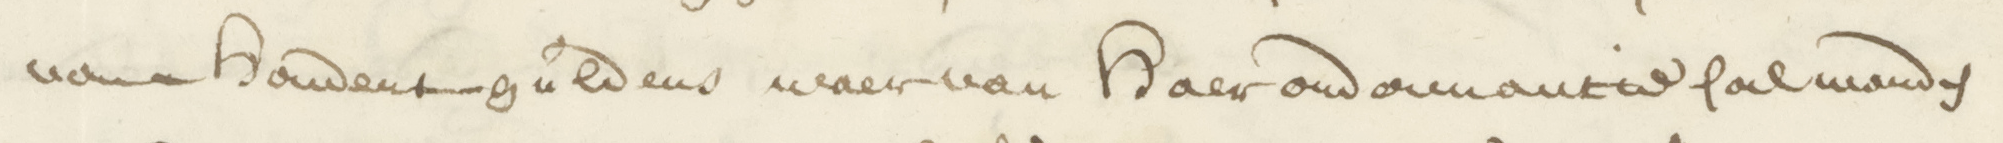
van hondert gulden waervan Haer ordonnantie sal werden
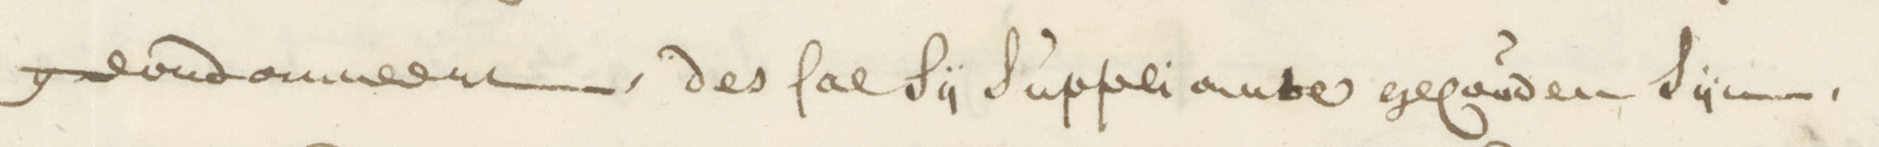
geordonneert, des sal sij suppliante gehouden sijn,
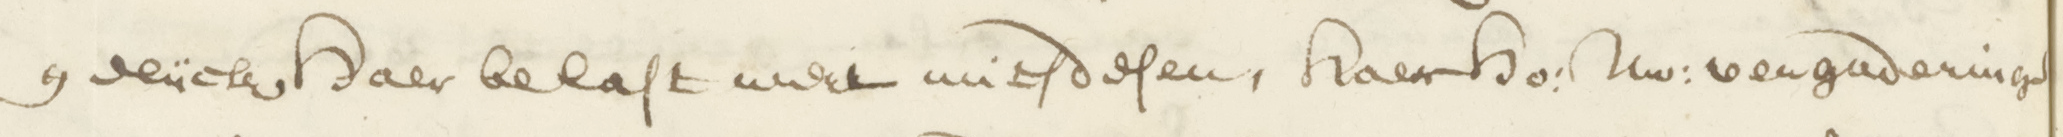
gelijck haer belast wert mitsdesen, haer Ho:Mo: vergaderinge
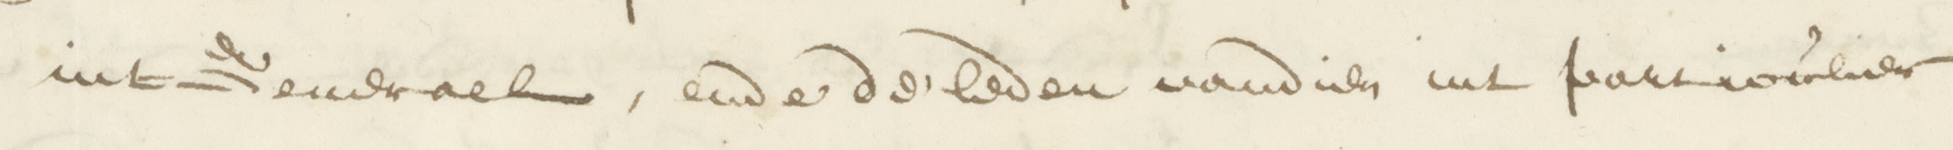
int Generael, ende de leden vandien int particulier
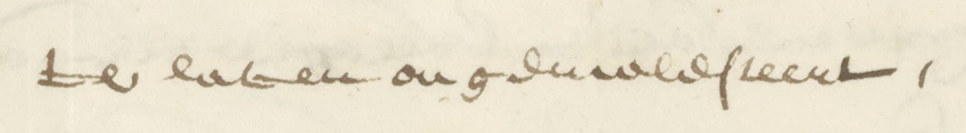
te laten ongemolesteert.
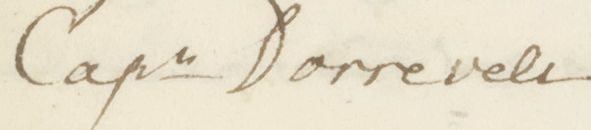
Capn Dorrevelt
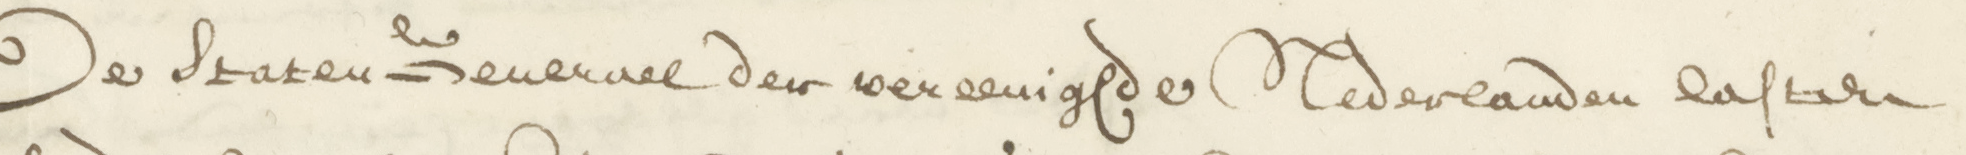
De Staten Generael der vereenighde Nederlanden lasten
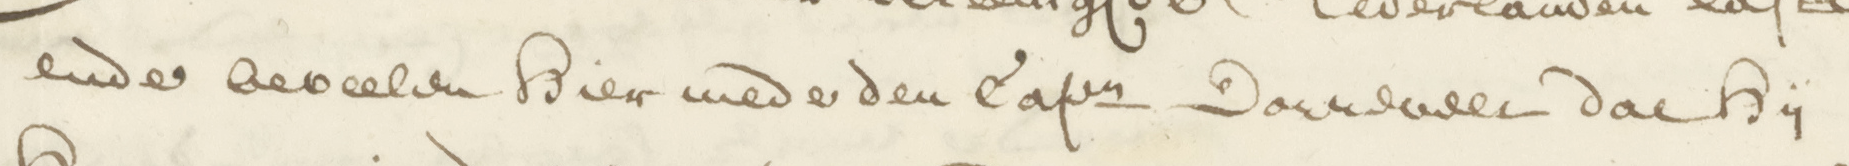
ende beveelen hier mede den capn. Dorrevelt dat hij
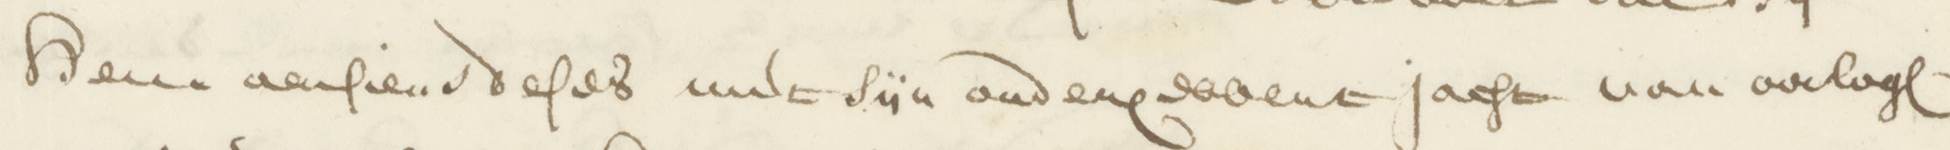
hem aensiens deses met sijn onderhebbent jacht van oorlogh
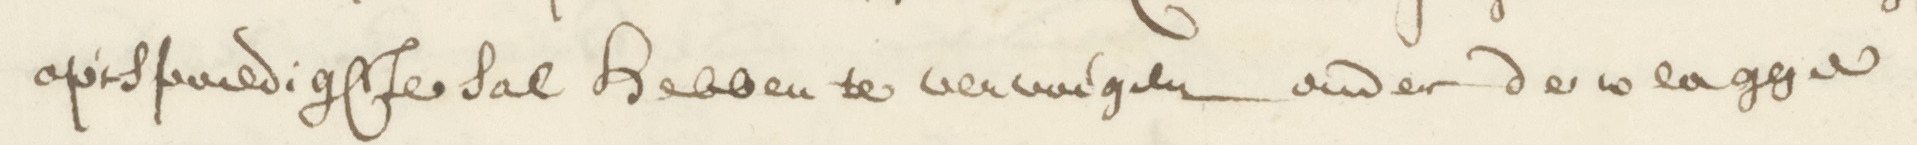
op't spoedighste sal hebben te vervoegen onder de vlagge
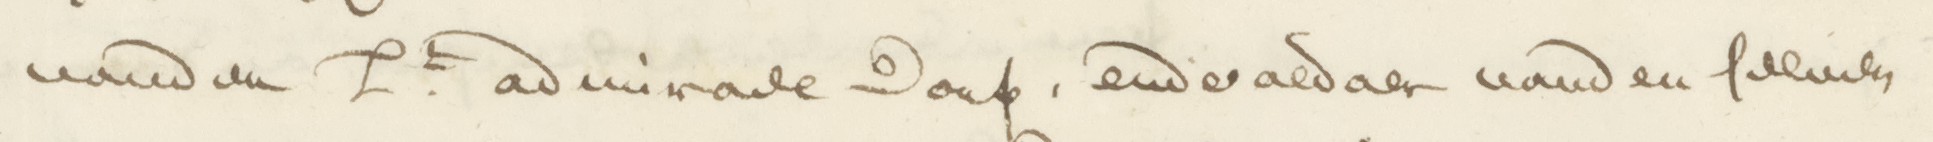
vanden Lt. admirael Dorp, ende aldaer vanden selven
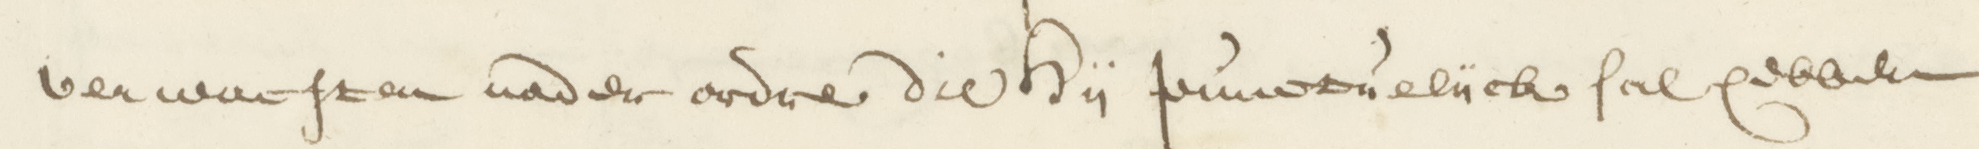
verwachten nader ordre die hij punctuelijck sal hebben
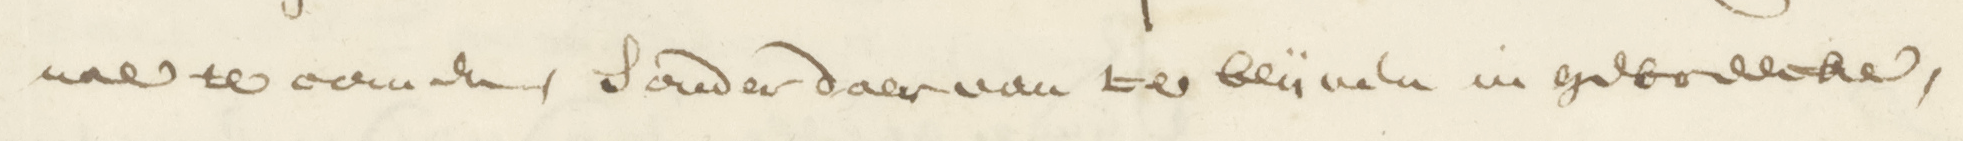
nae te comen, sonder daer van te blijven in gebreecke.
